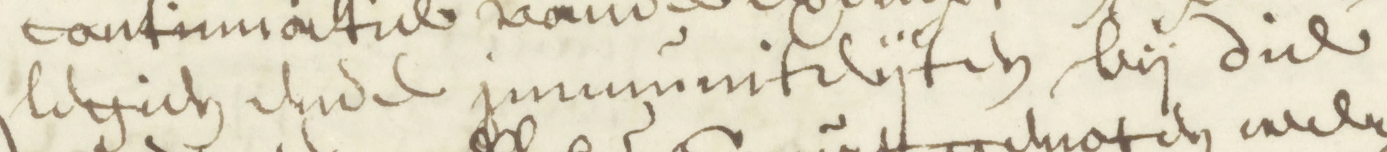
legien ende immuniteijten, bij die
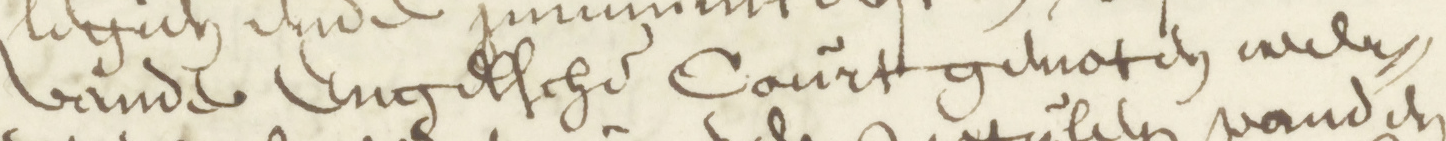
vande Engelsche Courtgenoten wer„
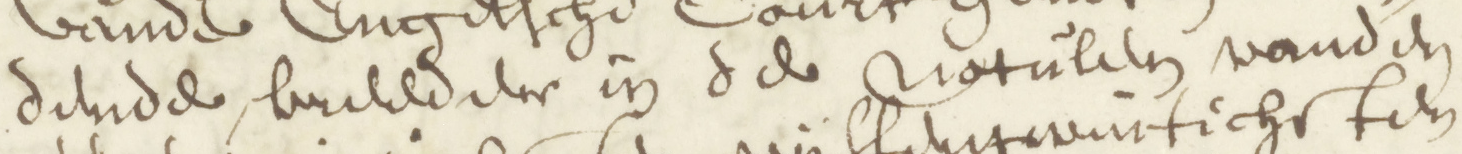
dende breeder in de notulen vanden
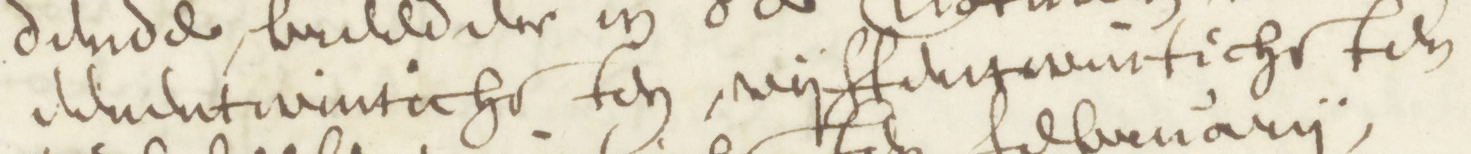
eenentwintichsten, vijffentwintichsten
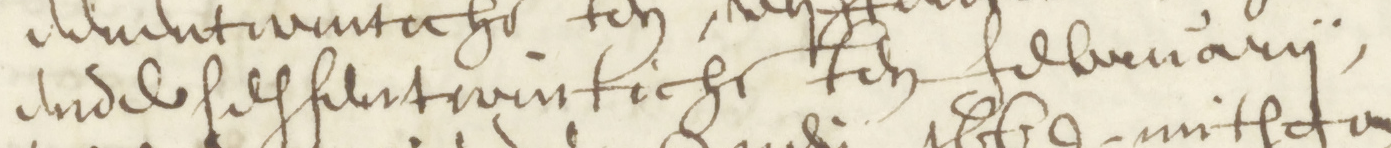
ende sessentwintichsten februarij,
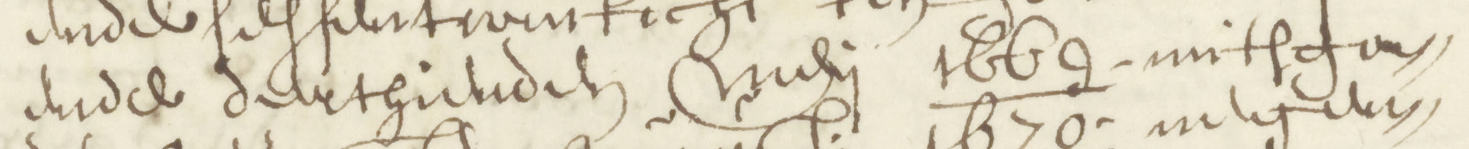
ende derthienden Meij 1669. mitsga„,
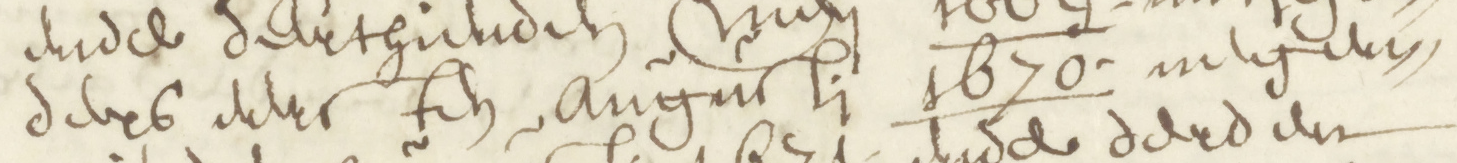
ders eersten Augusti 1670. negen„
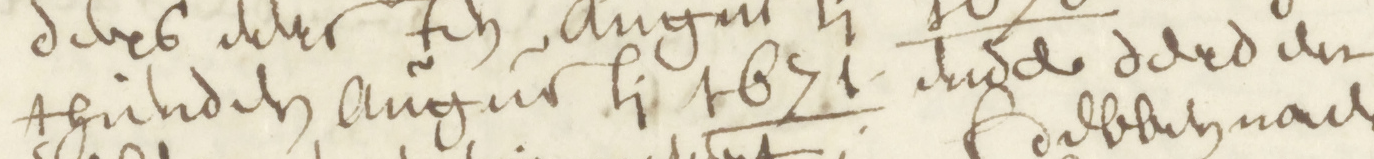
thienden Augusti 1671. ende derden
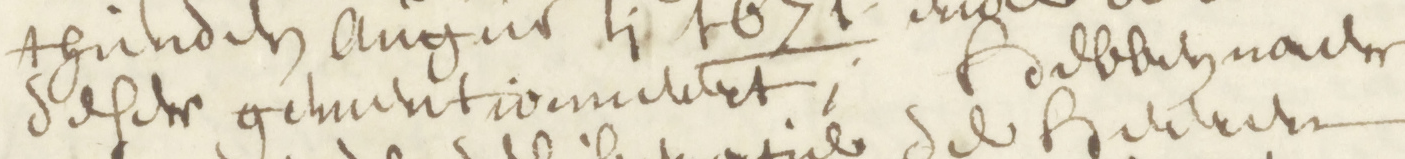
deser gementionneert; Hebben naer
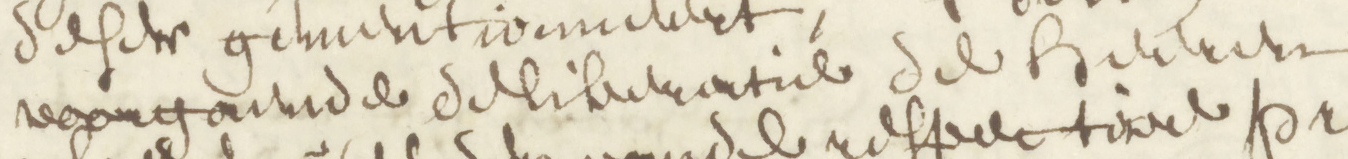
voorgaende deliberatie de Heeren
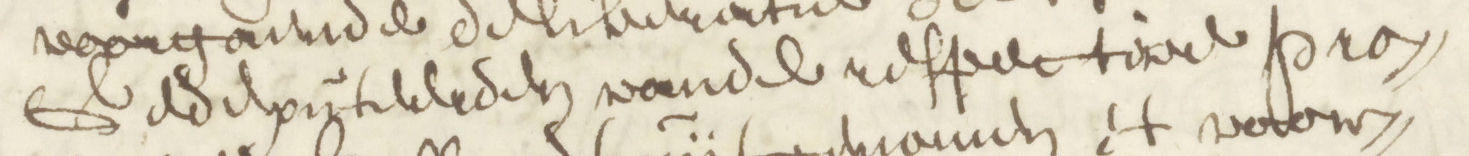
Gedeputeerden vande respective pro,,
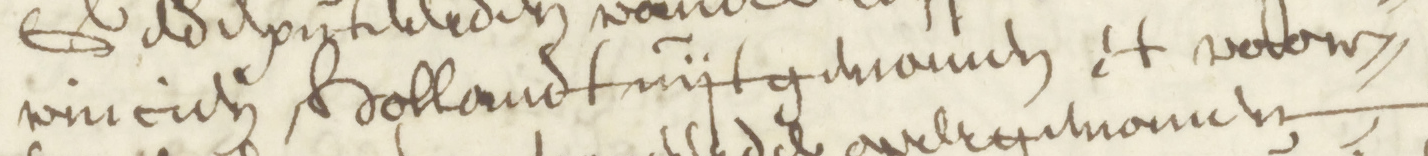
vincien Hollandt uijtgenomen, 't voor„
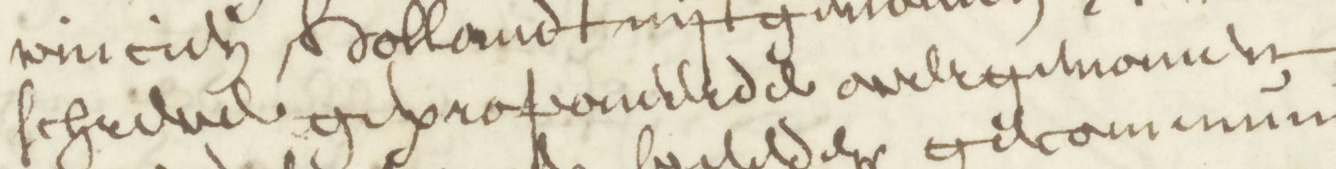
schreve geproponeerde overgenomen
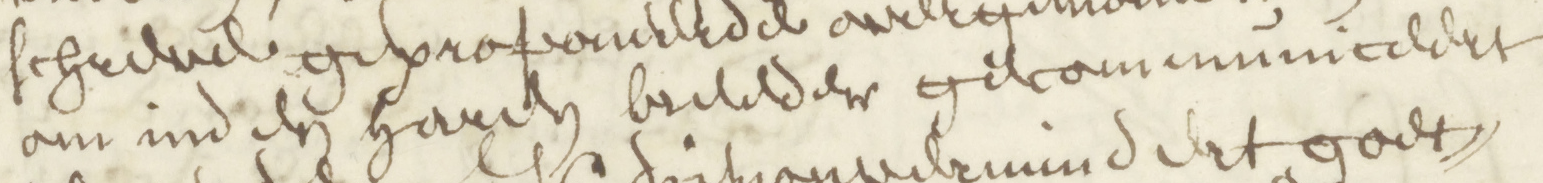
om inden haren breeder gecommuniceert
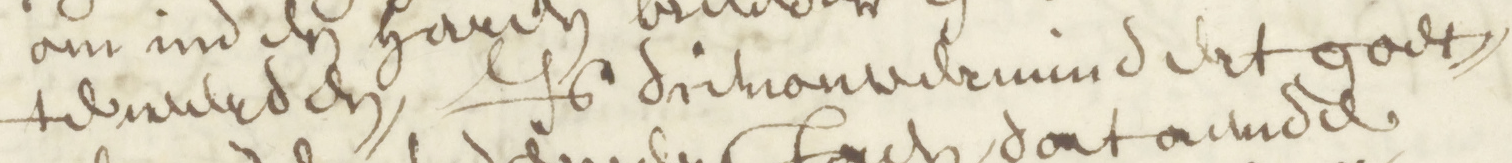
te werden. Is dienonvermindert goet,,
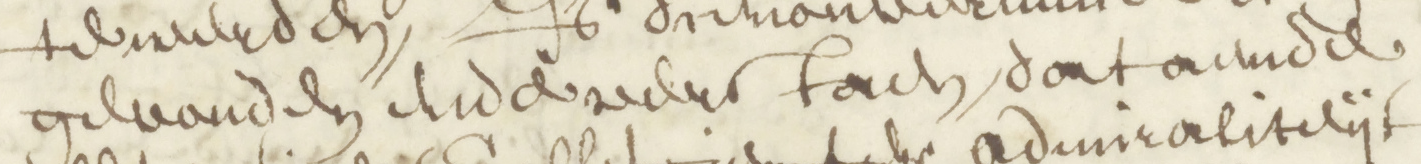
gevonden ende verstaen, dat aende
